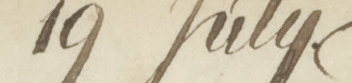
19 Julij
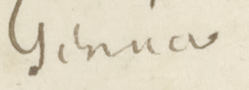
Genua
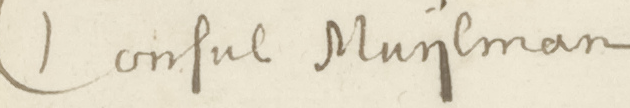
Consul Muijlman
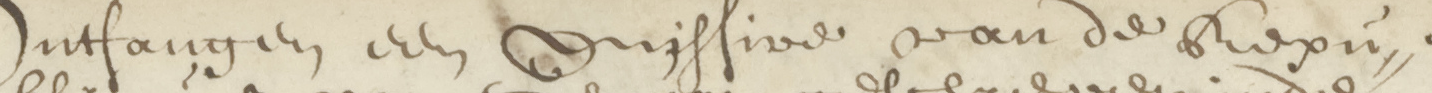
Ontfangen een Missive van de Repu„
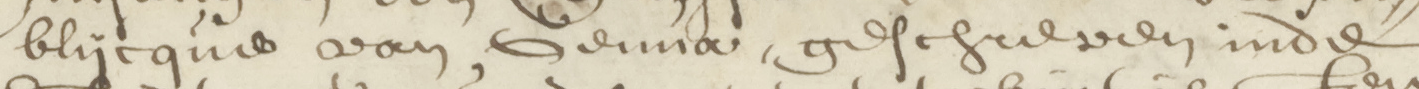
blijcque van Genua gescheven inde
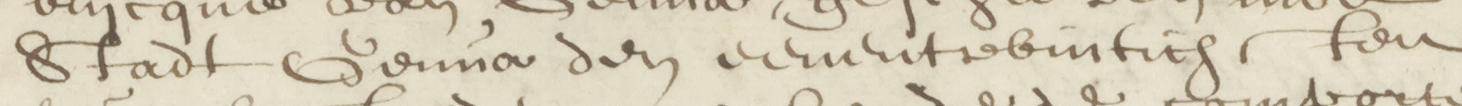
Stadt Genua den eenentwintichsten
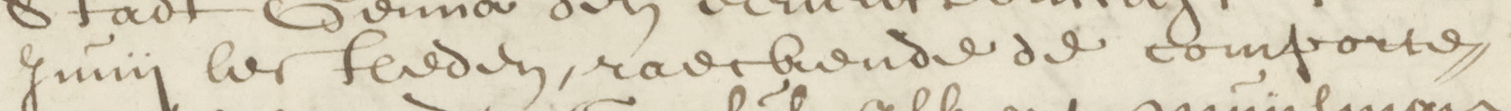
Junij lestleden, raeckende de comporte„
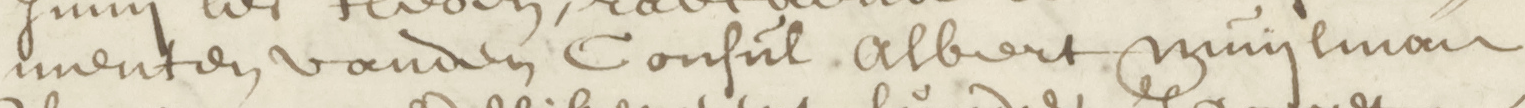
menten vanden Consul Albert Muijlman,
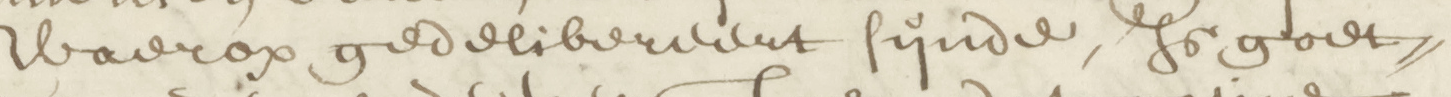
Waerop gedelibereert sijnde, Is goet„
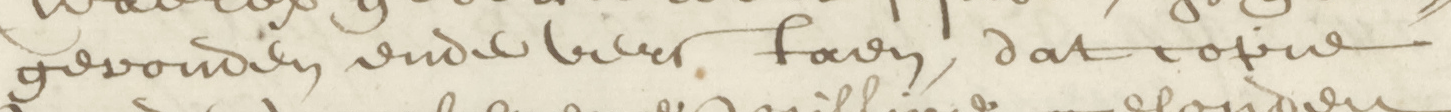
gevonden ende verstaen, dat copie
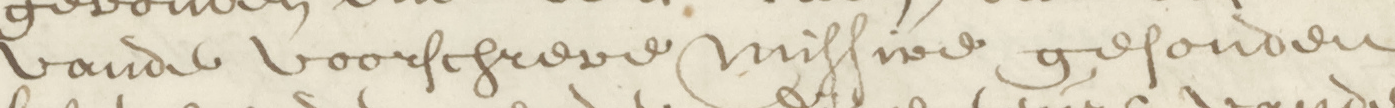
vande voorschreve Missive gesonden
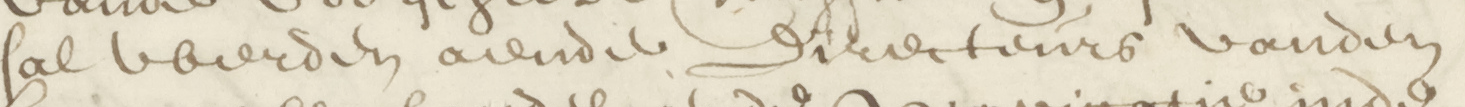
sal werden aende Directeurs vanden
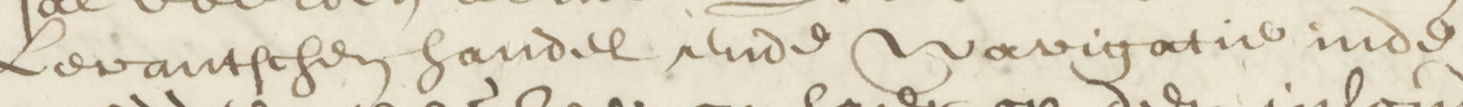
Levantschen handel ende Navigatie inde
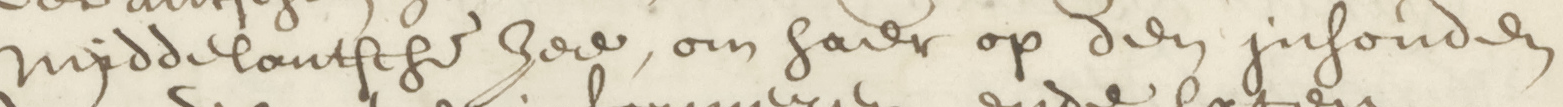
Middelantsche Zee, om haer op den inhouden
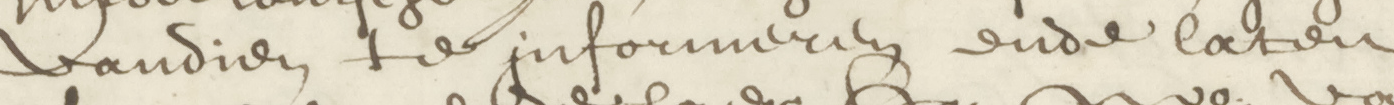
vandien te informeren ende laten
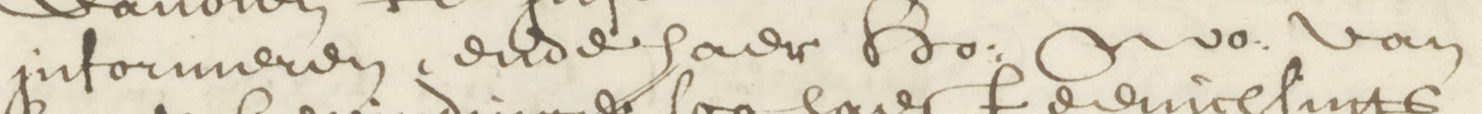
informeren, ende haer Ho:Mo: van
